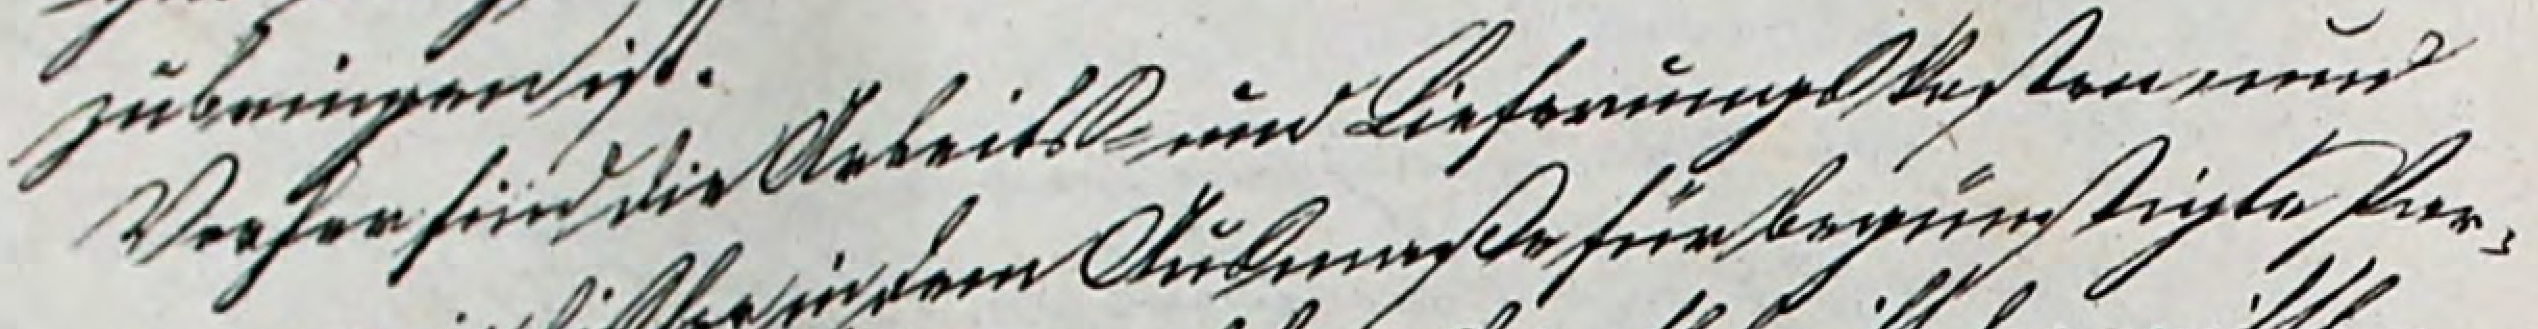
Vorher sind die Arbeits= und Lieferungskosten und
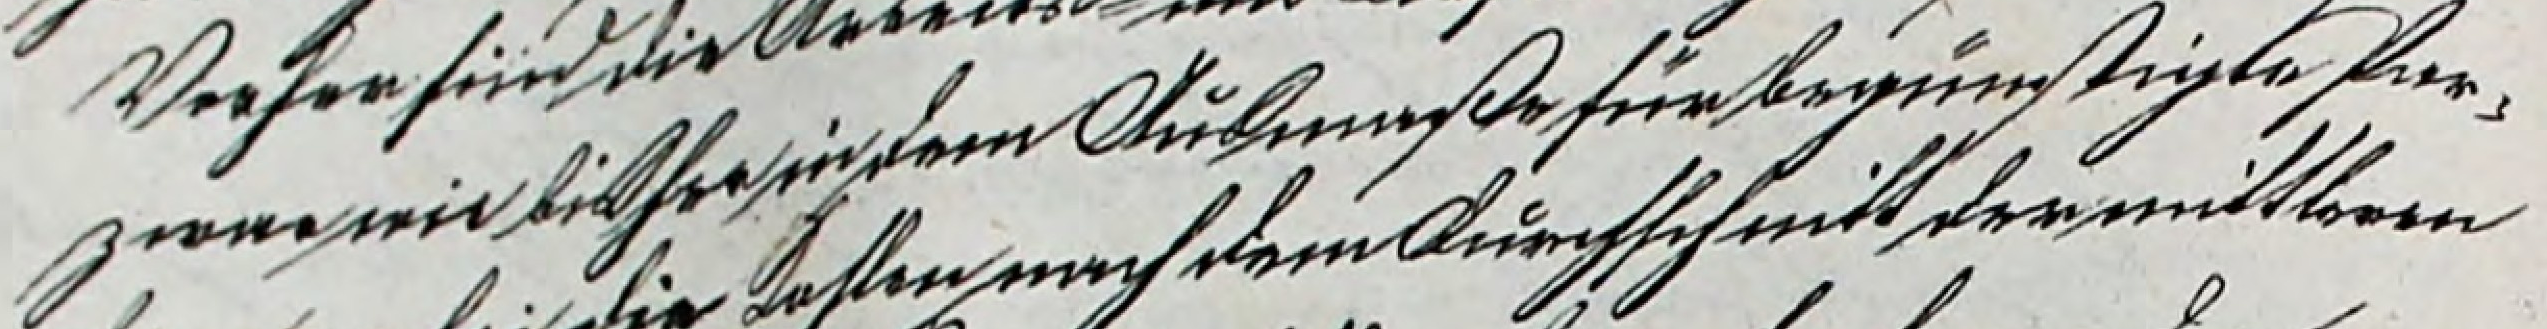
zwar wir bis her in dem Ausmaße für begünstigte Par„
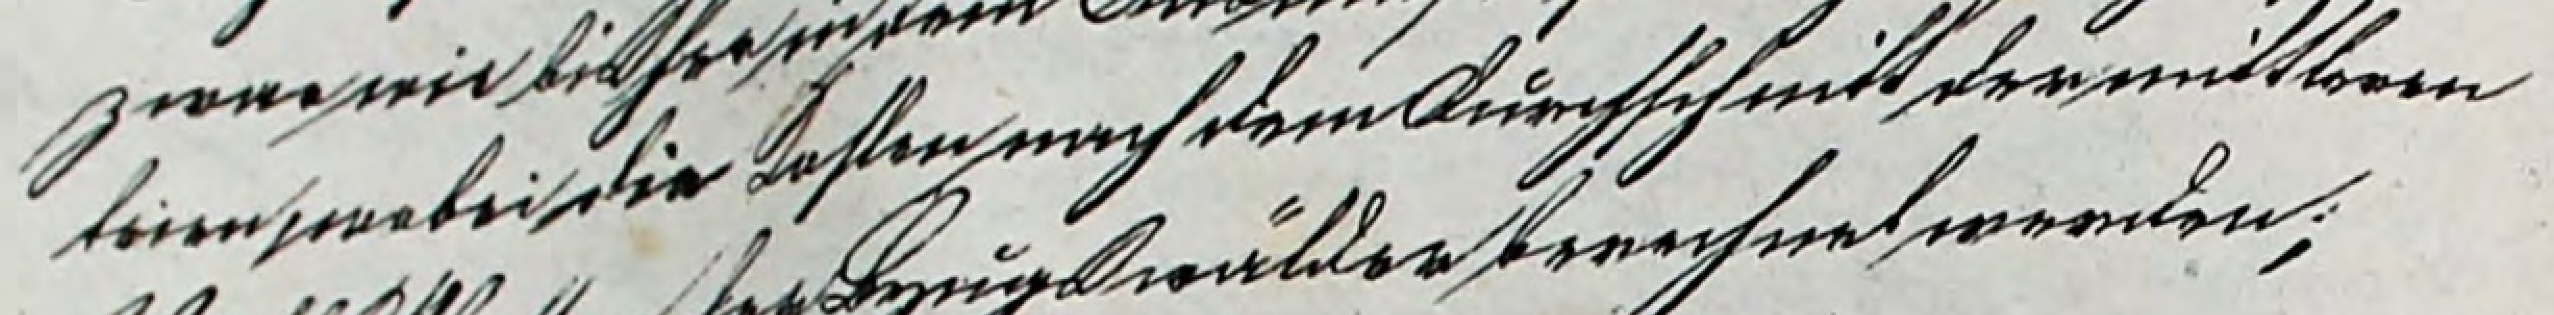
teien, wobei die Kosten nach dem Durchschnitt der mittleren
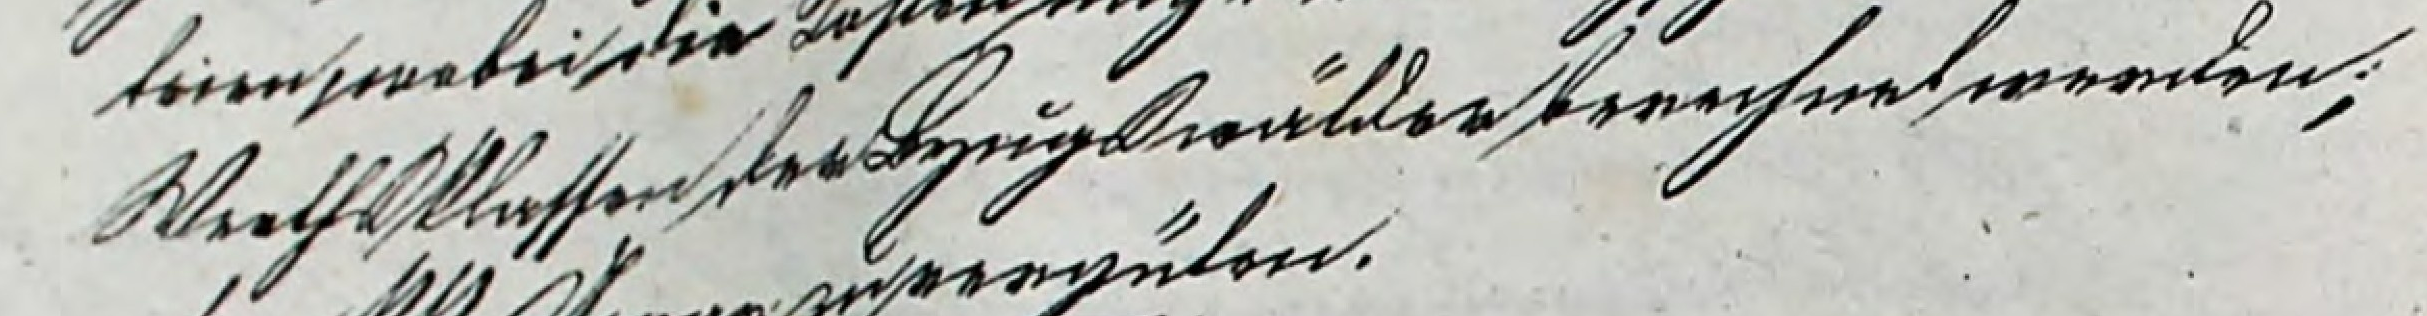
Werthsklassen der Bezugswälder berechnet werden;
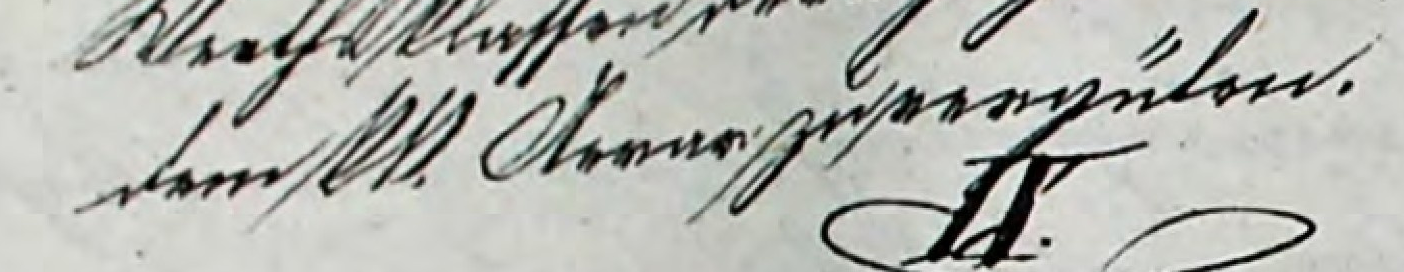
dem kk. Aerar zu vergüten.
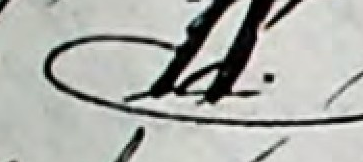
IX.
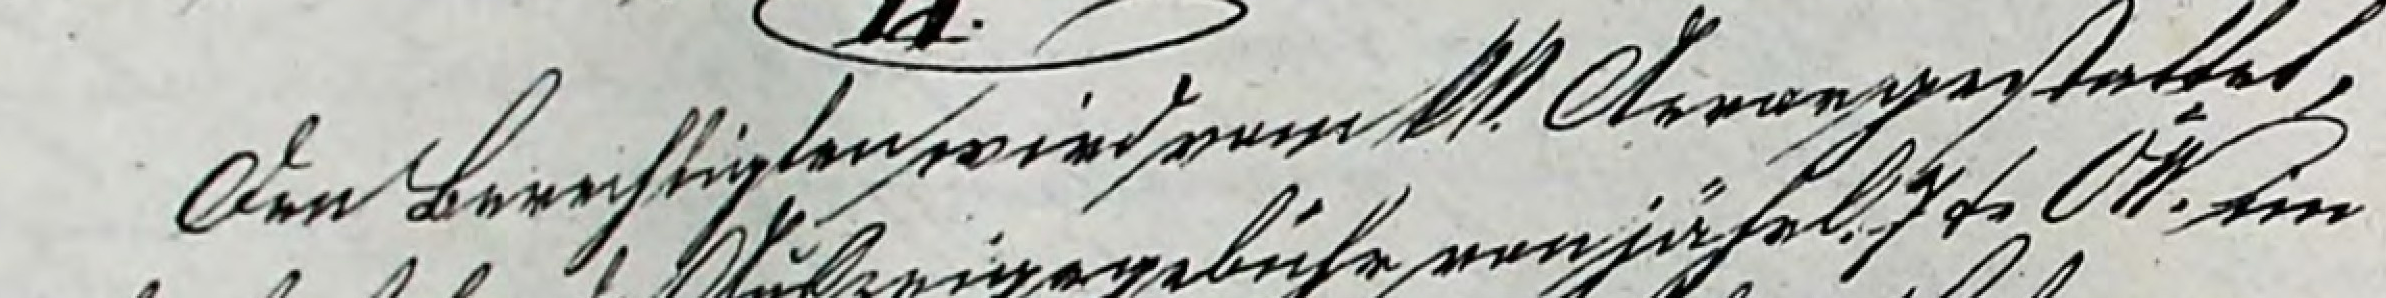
Den Berechtigten wird vom kk. Aerar gestattet,
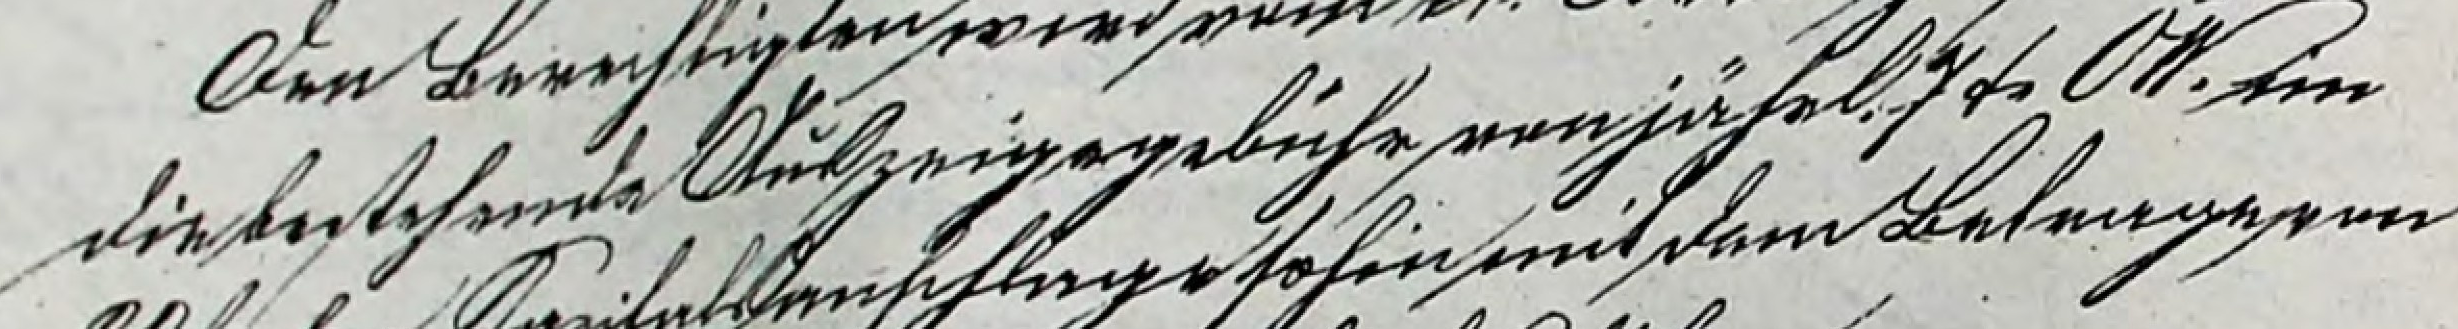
die bestehende Auszeigegebühr von jährl. 7 te ÖW. im
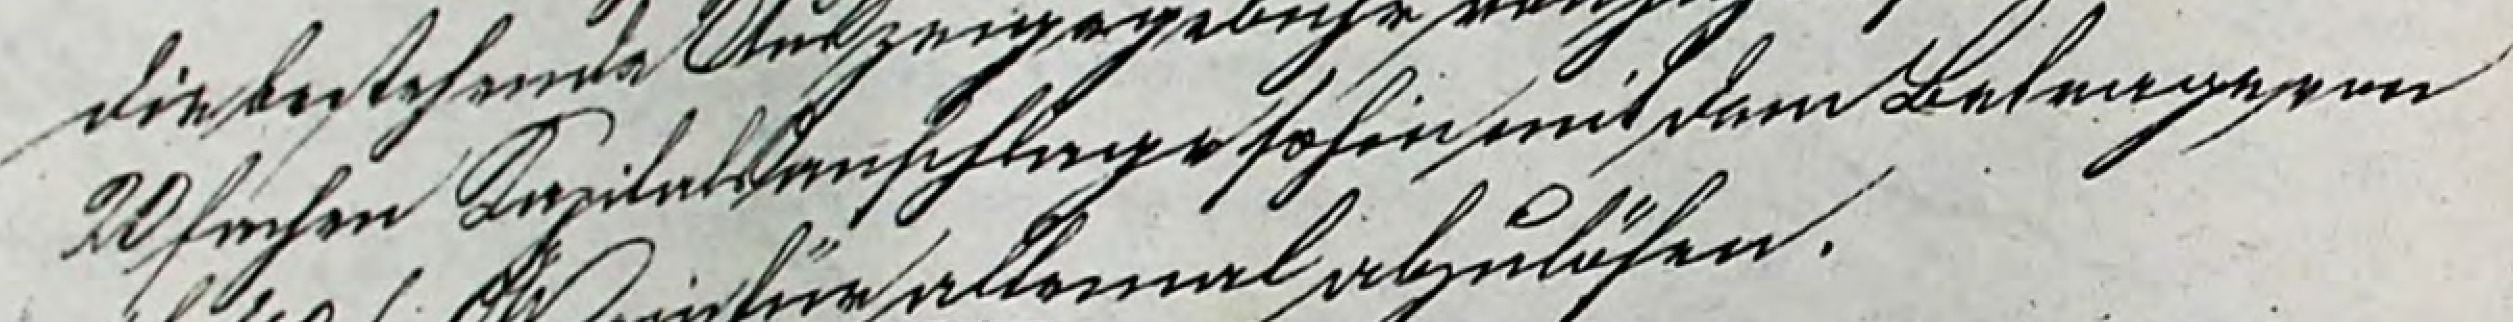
20 fachen Kapitals anschlage sohin mit dem Betrage von
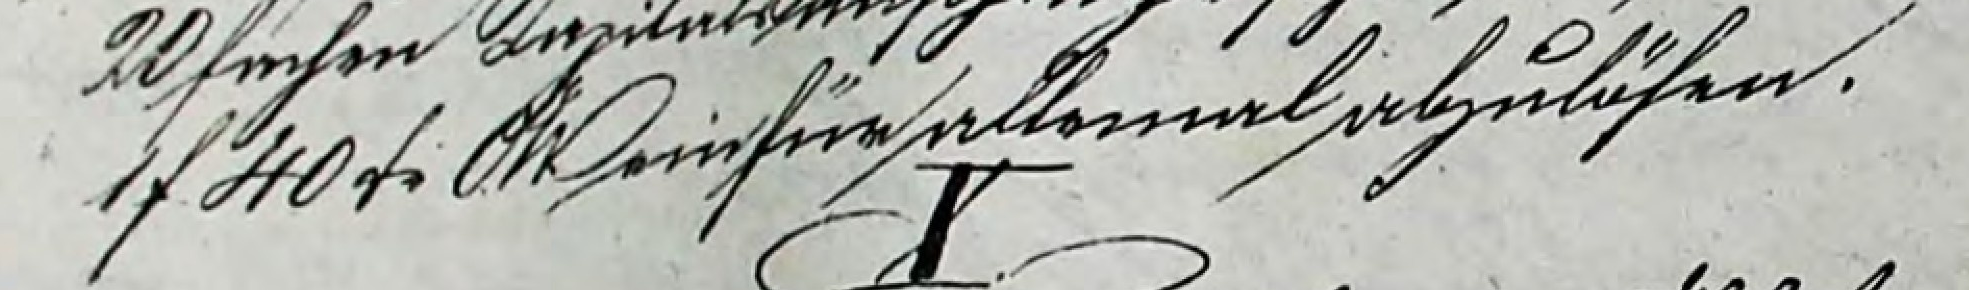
1f 40 te Ö.W ein für allemal abzulösen.
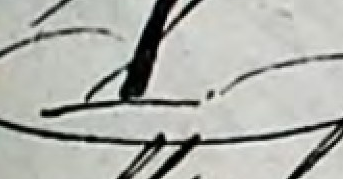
X.
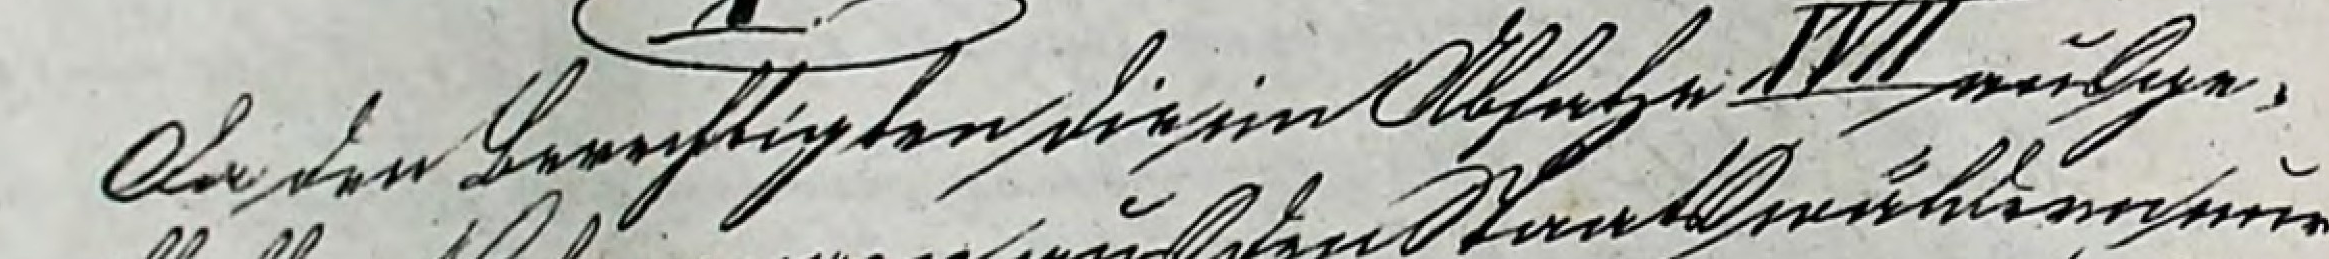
Da den Berechtigten die ein Absatze XVII ausge„
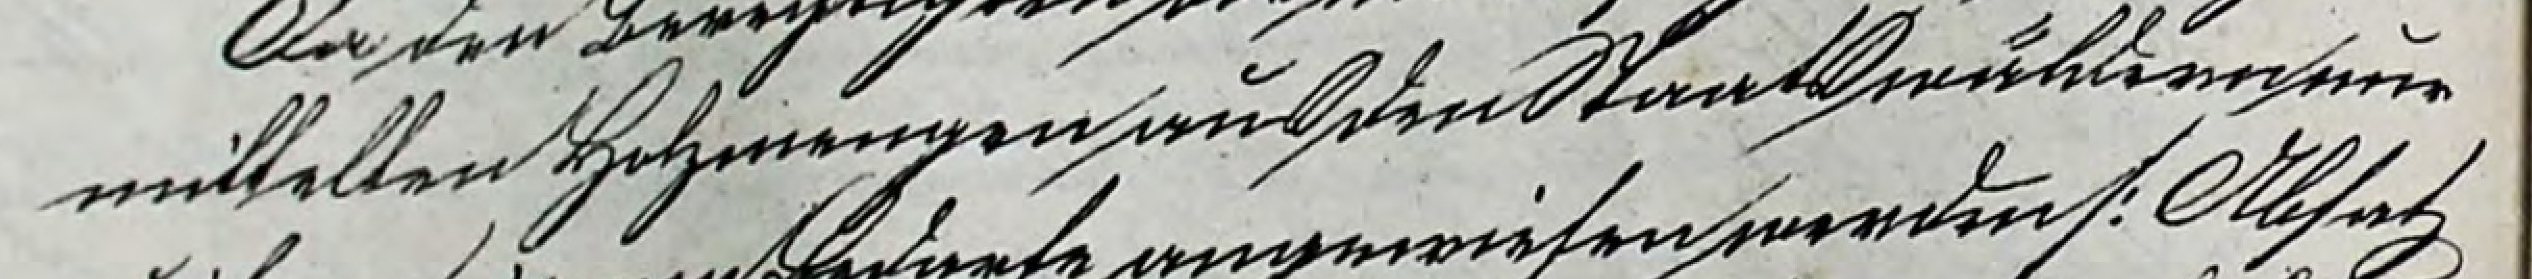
mittelten Holzmengen aus den Staatswäldern nur
